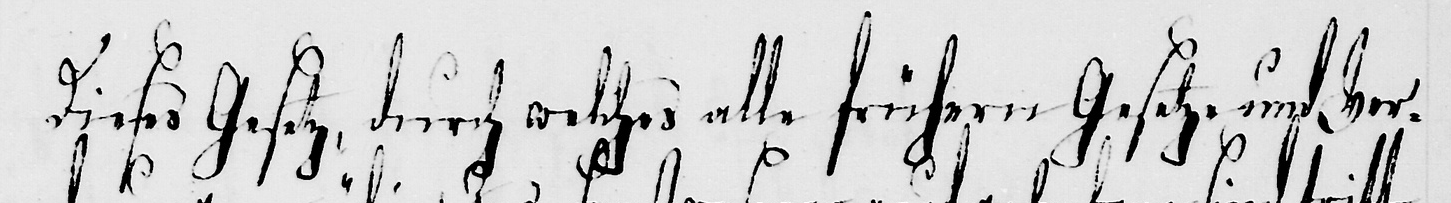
durch welches alle frühern Gesetze und
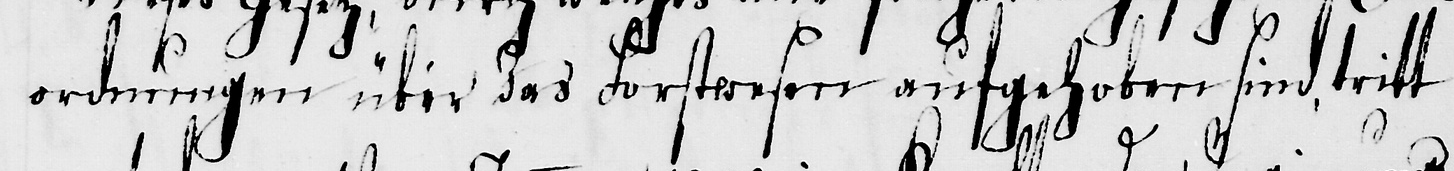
ordnungen über das Forstwesen aufgehoben sind, tritt
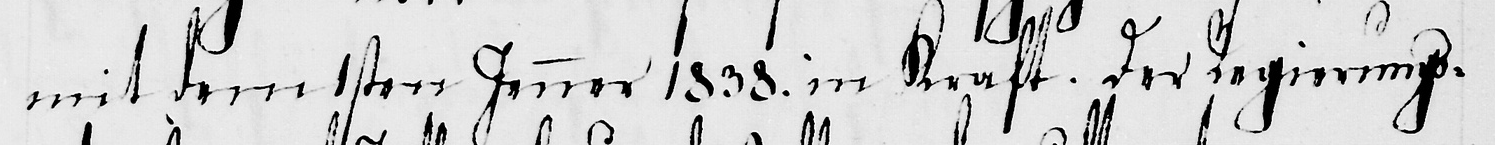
mit dem 1sten Jenner 1838. in Kraft. Der Regierungs¬
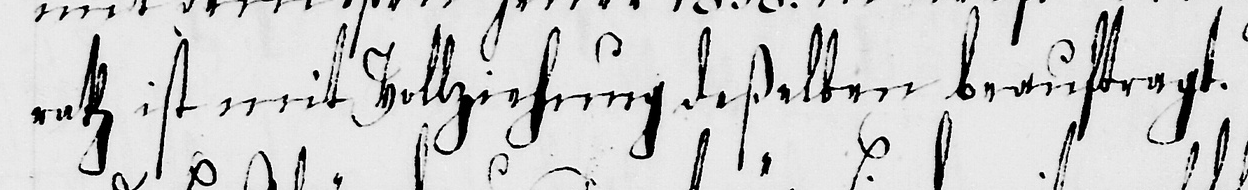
rath ist mit Vollziehung deßselben beauftragt.
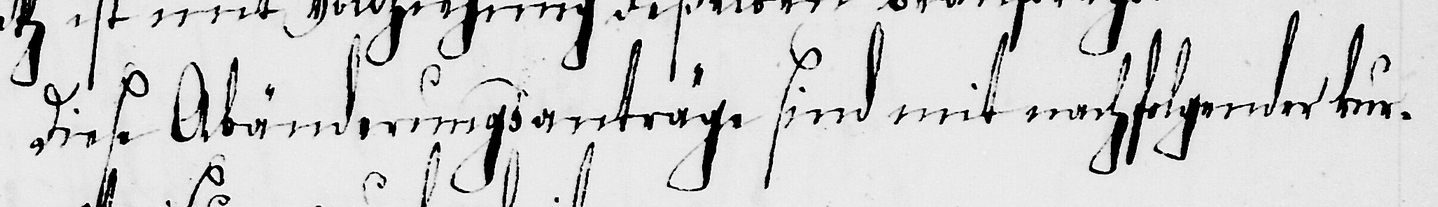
Diese Abänderungsanträge sind mit nachfolgender kur¬
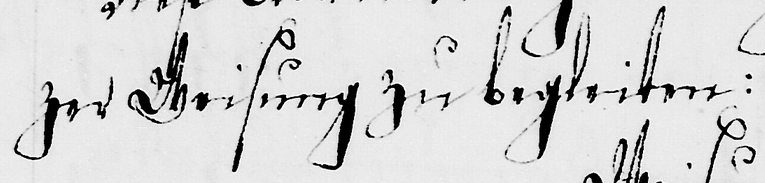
zer Weisung zu begleiten:
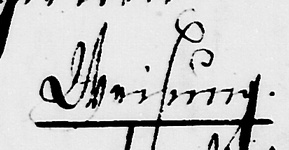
Weisung.
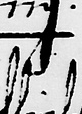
if¬
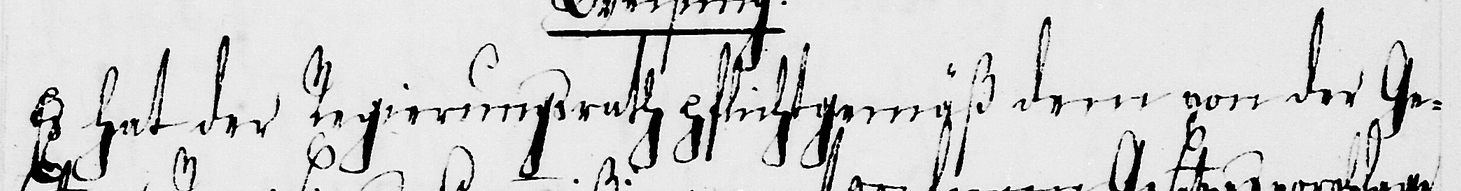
Es hat der Regierungsrath pflichtgemäß dem von der Ge¬
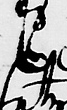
Ver¬
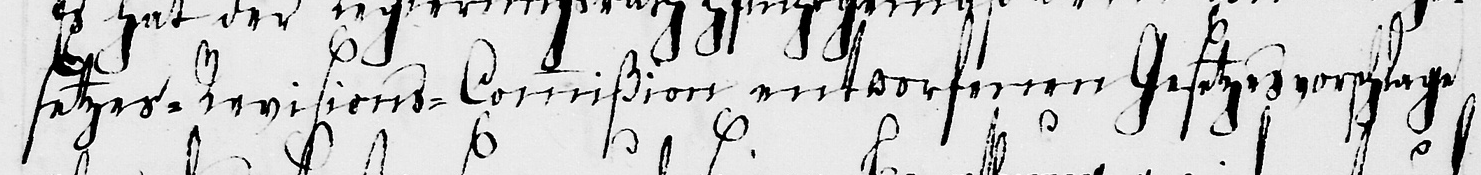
setzes-Revisions-Commißion entworfenen Gesetzesvorschlage
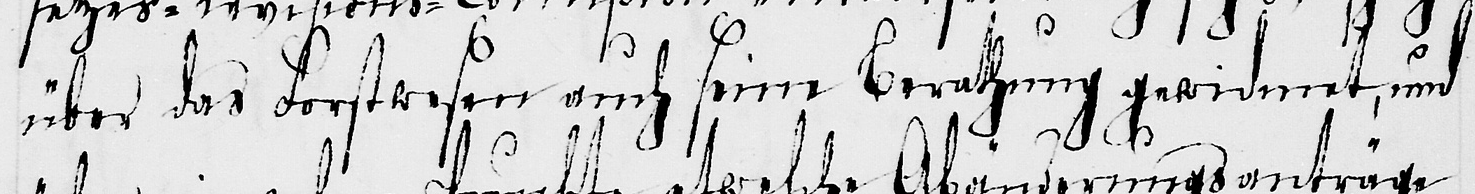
über das Forstwesen auch seine Berathung gewidmet, und
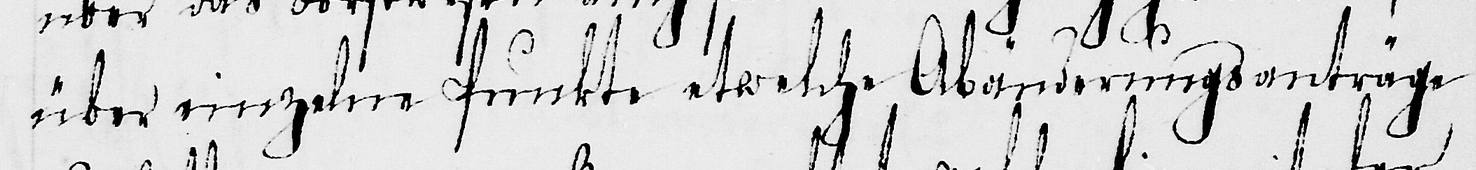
über einzelne Punkte etwelche Abänderungsanträge
